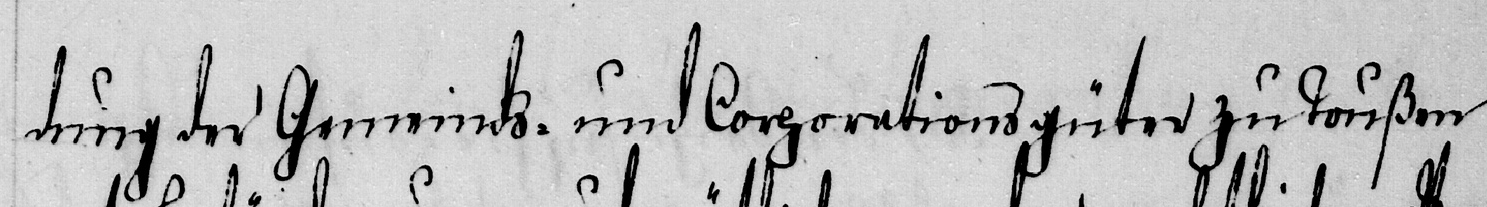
dung der Gemeinds- und Corporationsgüter zu Toußen
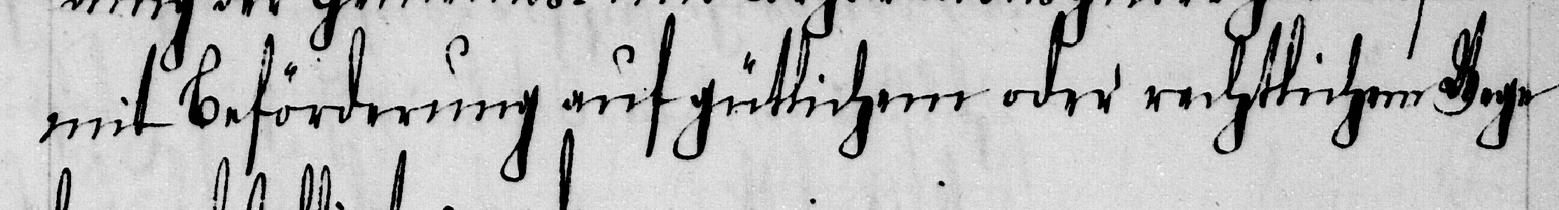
mit Beförderung auf gütlichem oder rechtlichem Wege
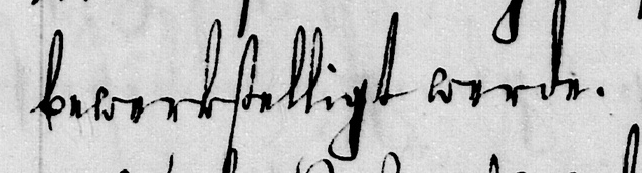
bewerkstelligt werde.
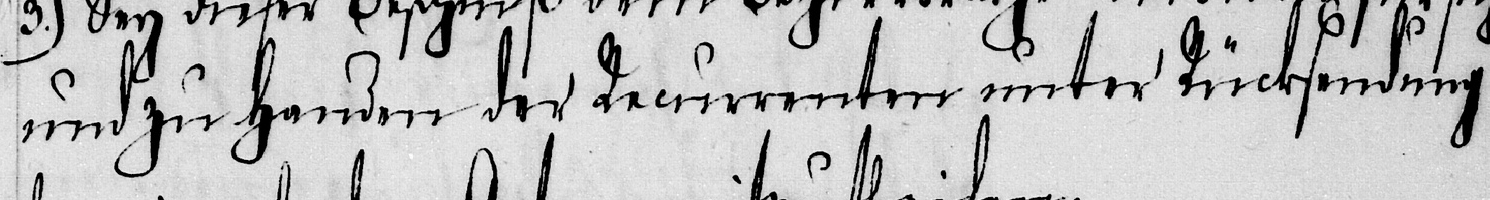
und zu Handen der Recurrenten unter Rücksendung
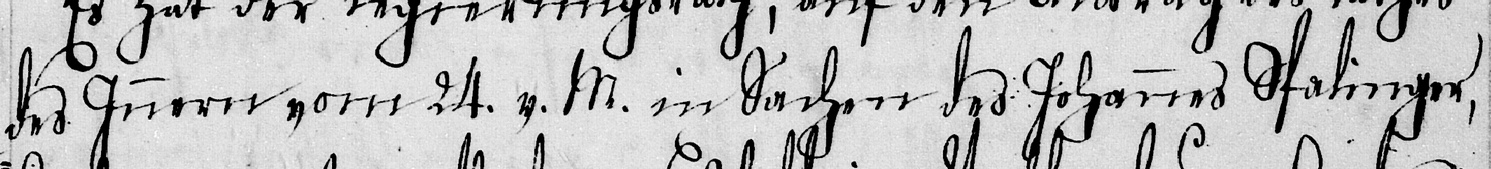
des Innern vom 24. v. M. in Sachen des Johannes Spalinger,
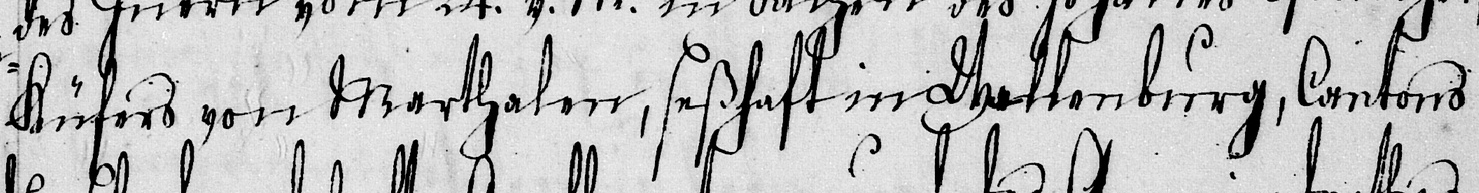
Küfers von Marthalen, seßhaft in Wallenburg, Canton¬
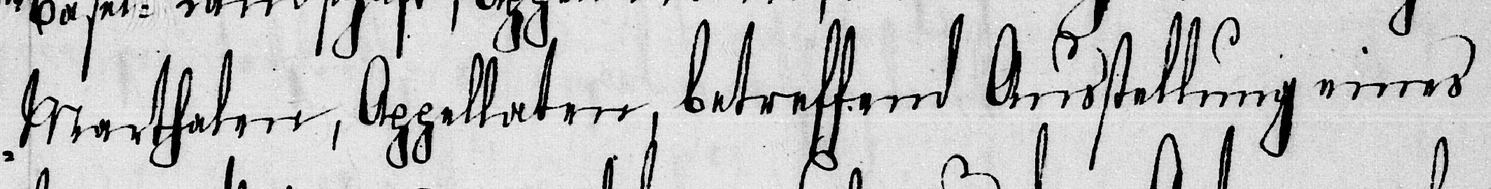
Marthalen, Appellaten, betreffend Ausstellung eines
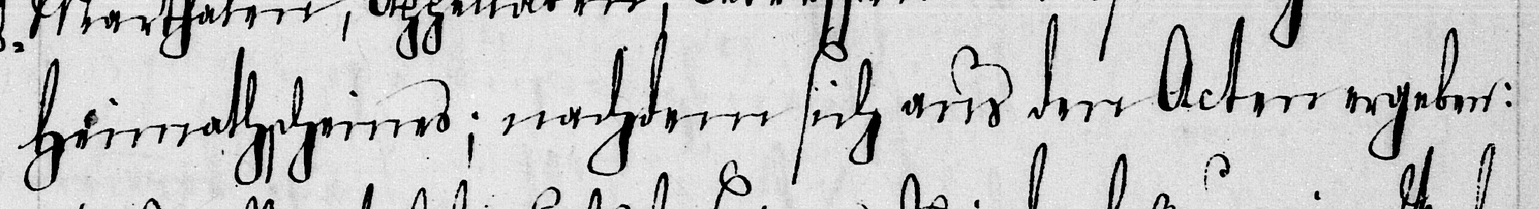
Heimathscheines; nachdem sich aus den Acten ergeben:
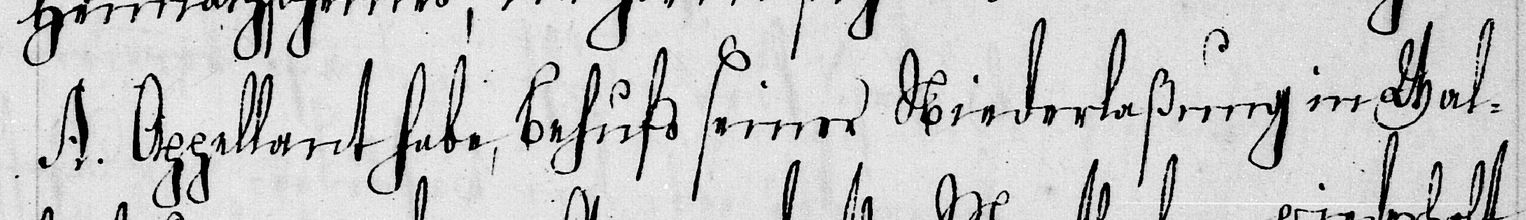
A. Appellant habe, Behufs seiner Niederlaßung in Wal¬
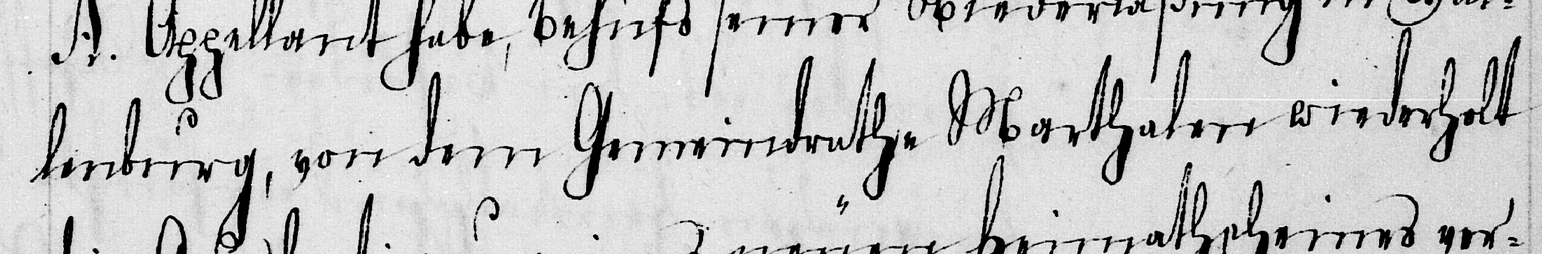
lenburg, von dem Gemeindrathe Marthalen wiederholt
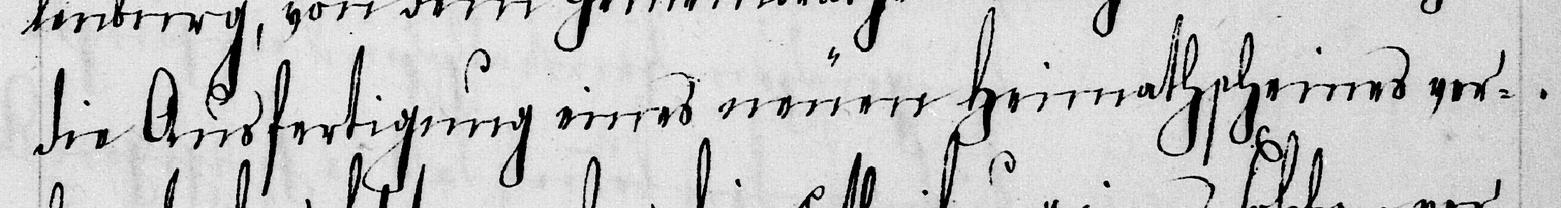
die Ausfertigung eines neuen Heimathscheines ver¬
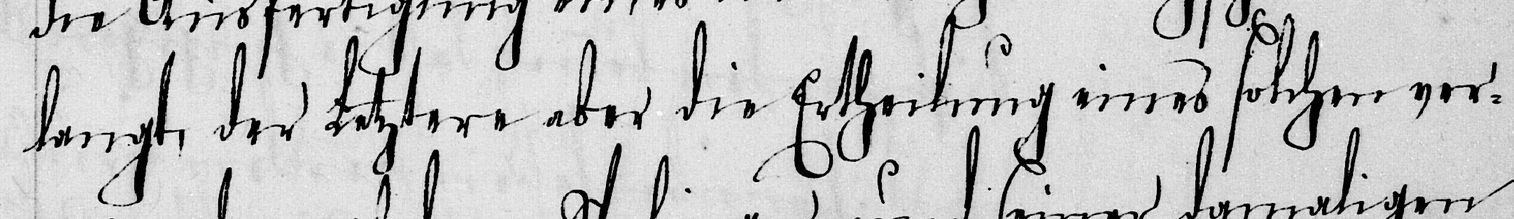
langt, der Letztere aber die Ertheilung eines solchen ver¬
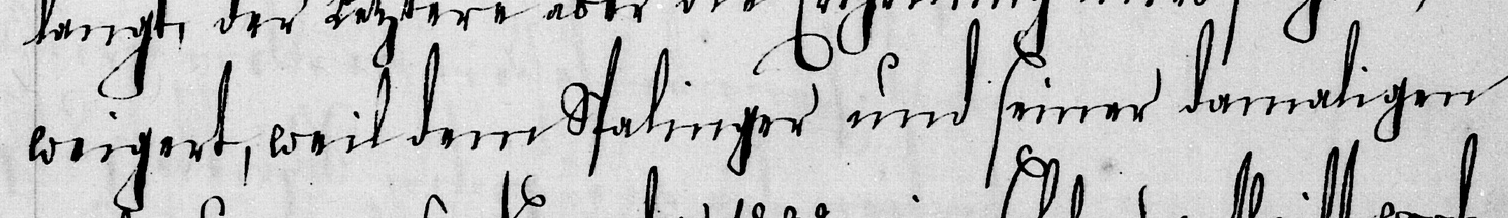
weigert, weil dem Spalinger und seiner damaligen
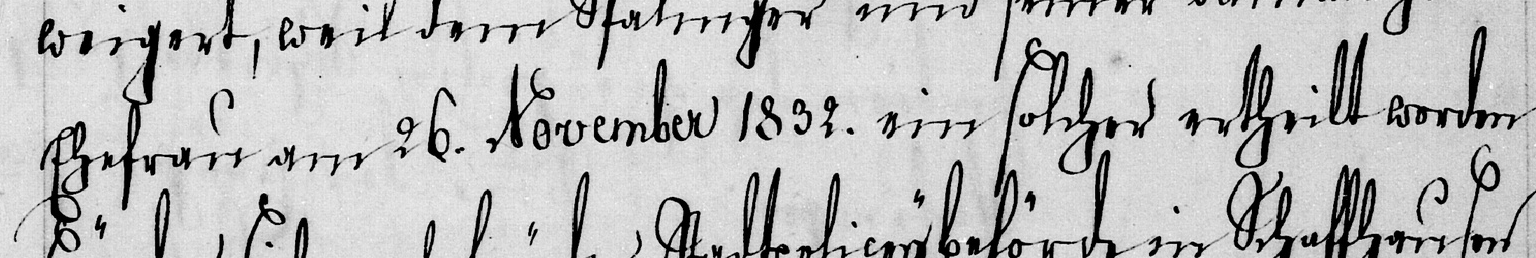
Ehefrau am 26. November 1832. ein solcher ertheilt worden
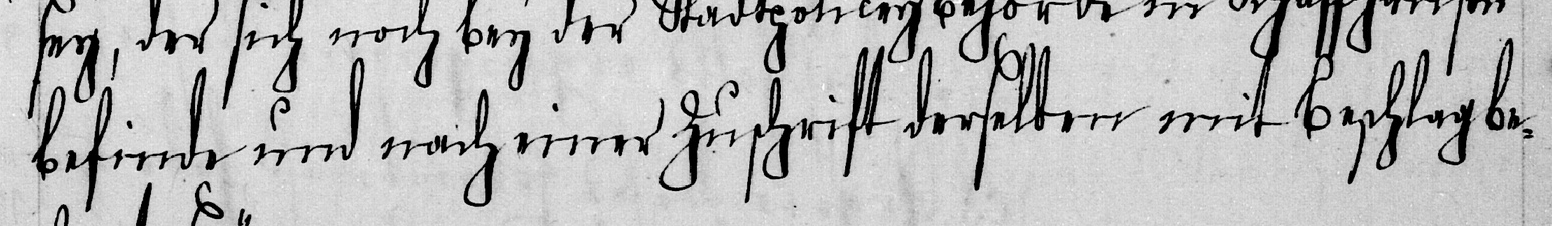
befinde und nach einer Zuschrift derselben mit Beschlag be¬
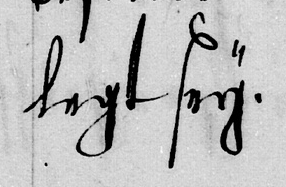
legt sey.
